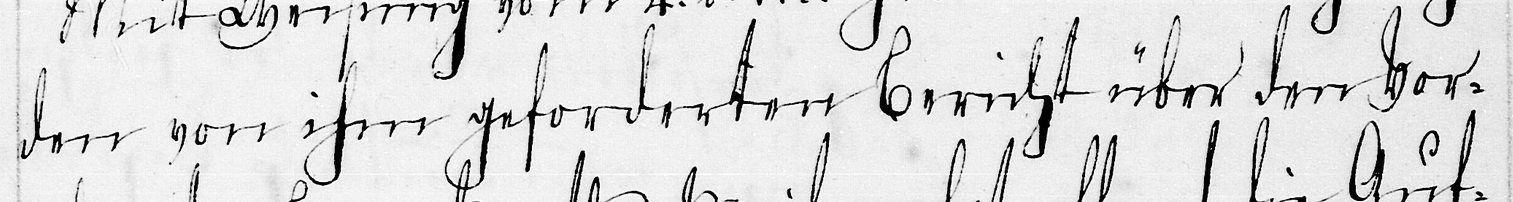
den von ihm geforderten Bericht über den Vors¬
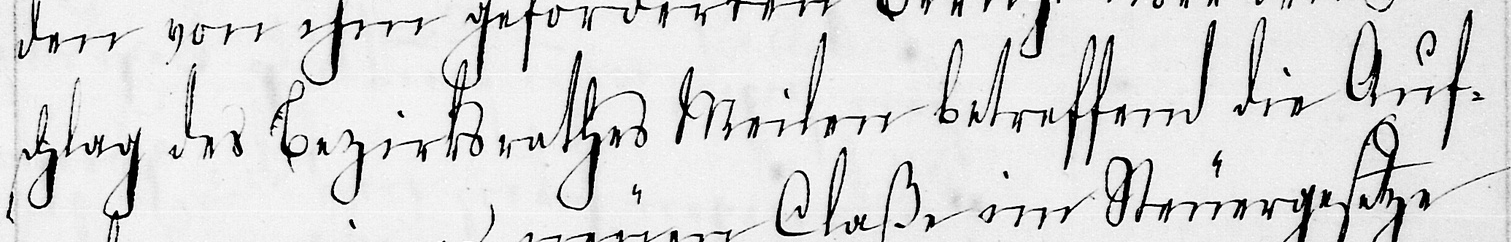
chlag des Bezirksrathes Meilen betreffend die Auf¬
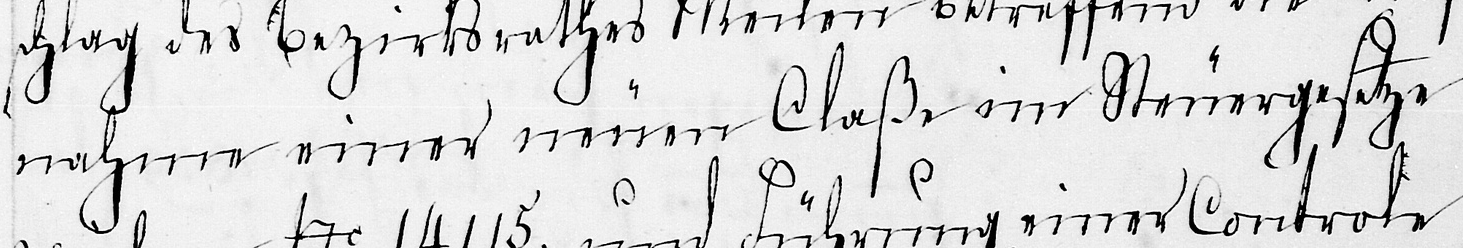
nahme einer neuen Claße im Steuergesetze
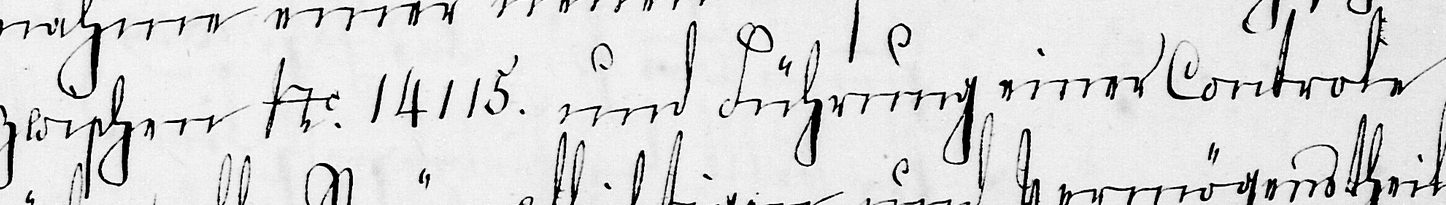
zwischen No. 14 115. und Führung einer Controle
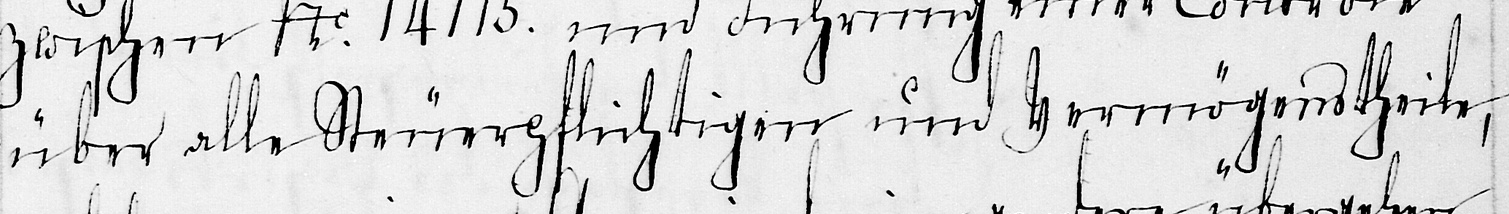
über alle Steuerpflichtigen und Vermögenstheile,
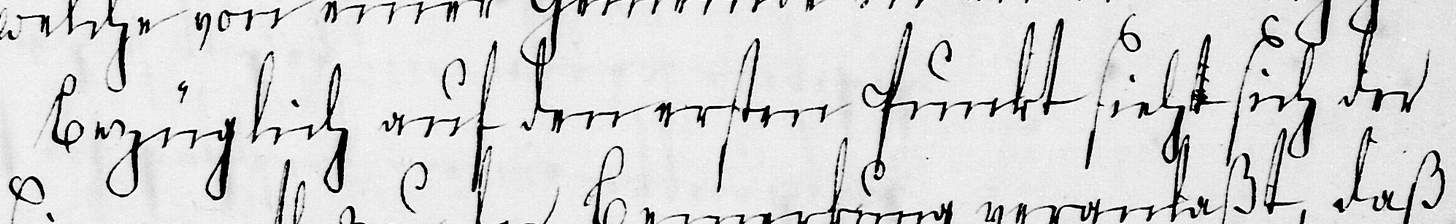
Bezüglich auf den ersten Punkt sieht sich der
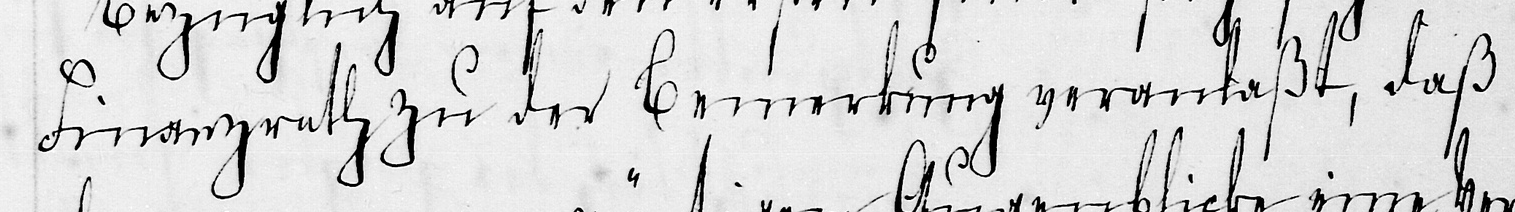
Finanzrath zu der Bemerkung veranlaßt, daß
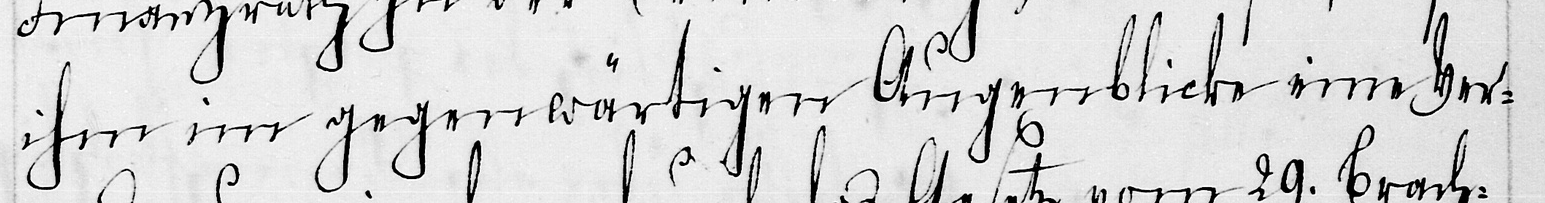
ihm im gegenwärtigen Augenblicke eine Ver¬
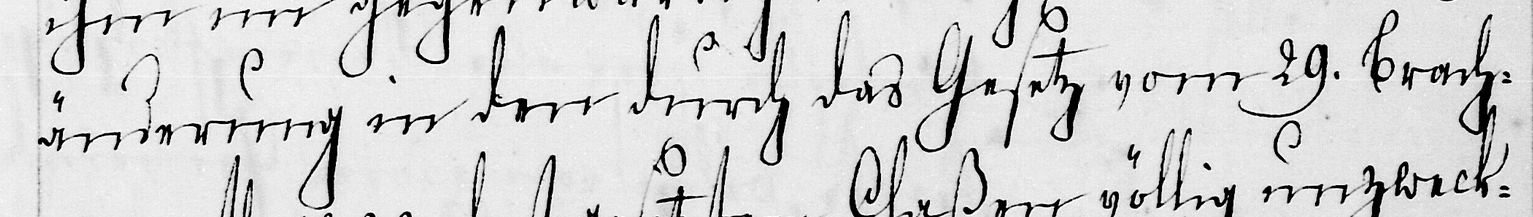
änderung in den durch das Gesetz vom 29. Brach¬
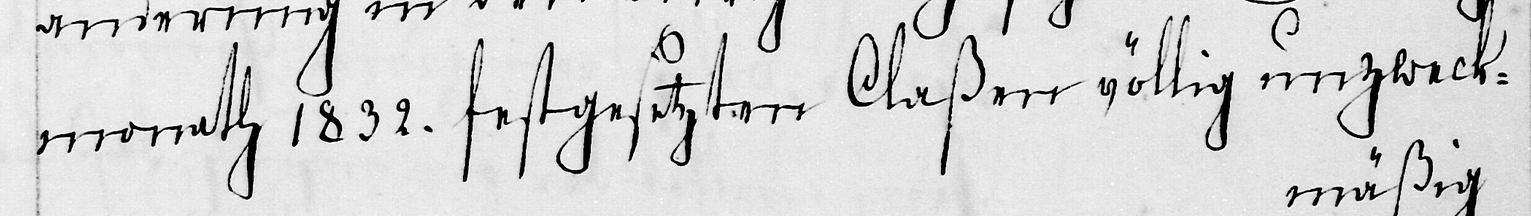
monath 1832. festgesetzten Claßen völlig unzweck-
